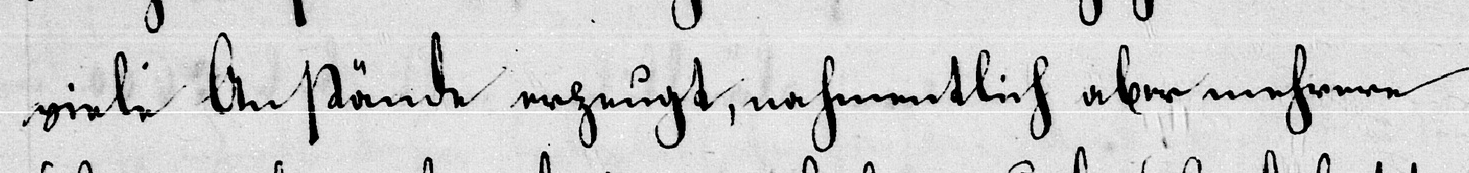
viele Anstände erzeugt, nahmentlich aber mehrere
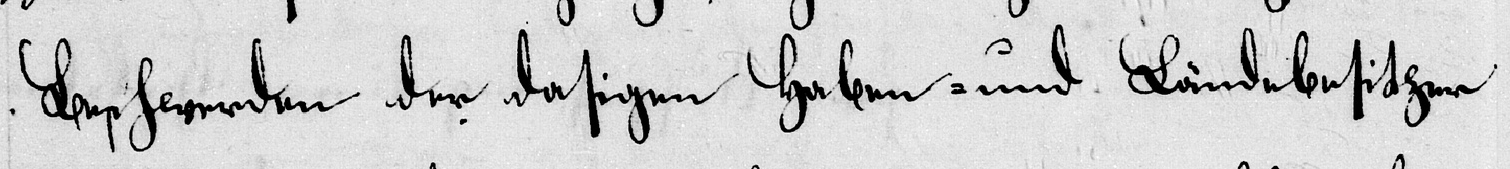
Beschwerden der dasigen Haben- und Ländebesitzer
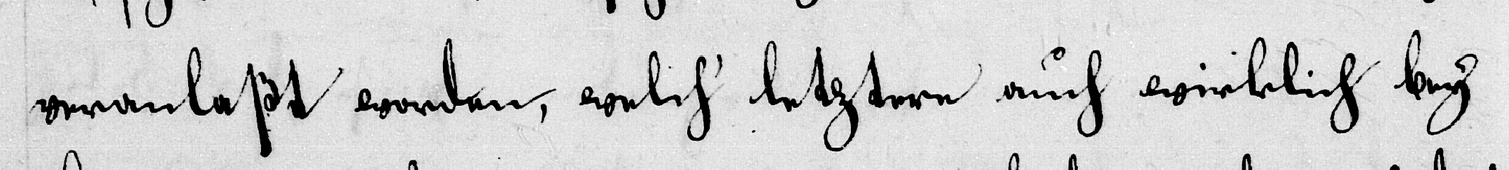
veranlaßt worden, welch’ letztern auch wirklich bey
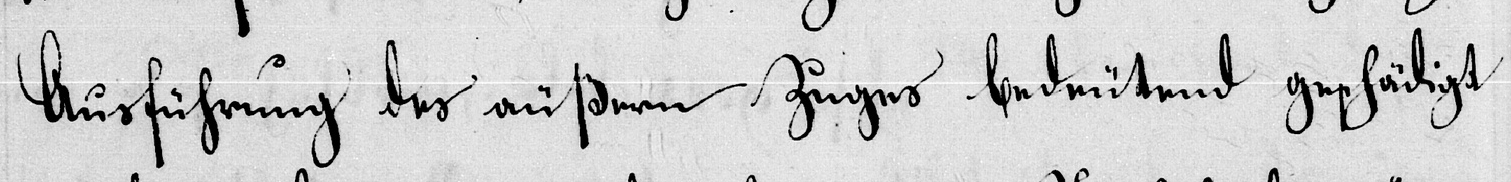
Ausführung des äußern Zuges bedeutend geschädigt
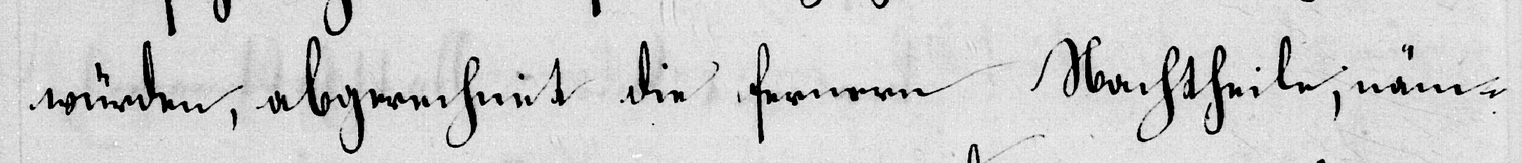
würden, abgerechnet die ferneren Nachtheile, näm¬
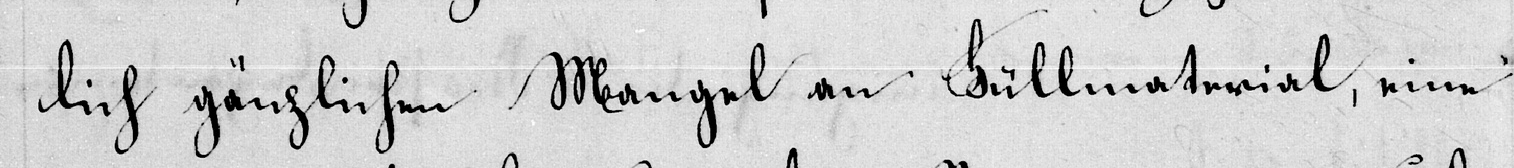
lich gänzlichen Mangel an Füllmaterial, eine
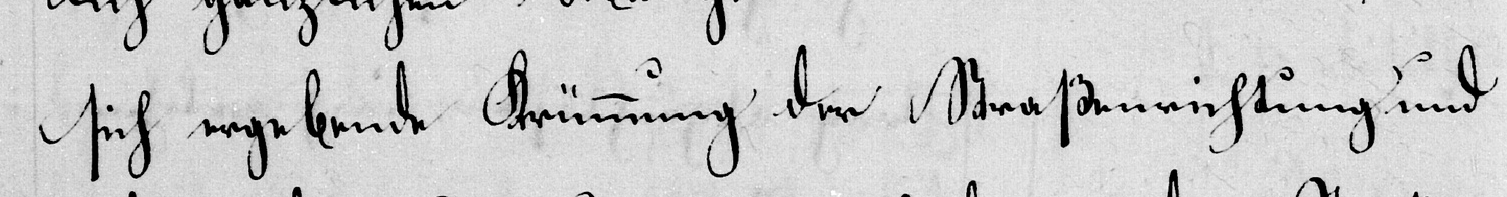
sich ergebende Krümmung der Straßenrichtung und
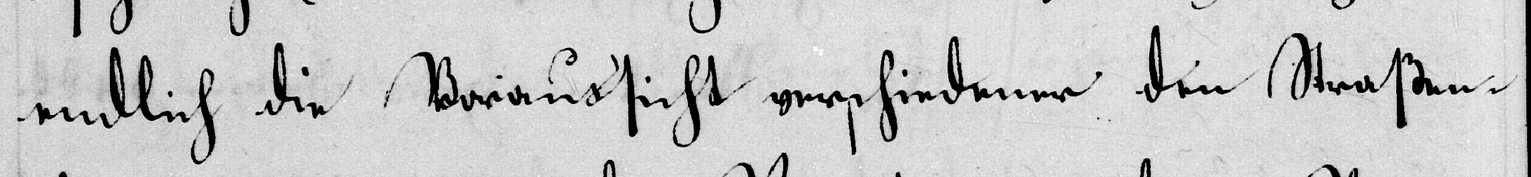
endlich die Voraussicht verschiedener den Straßen¬
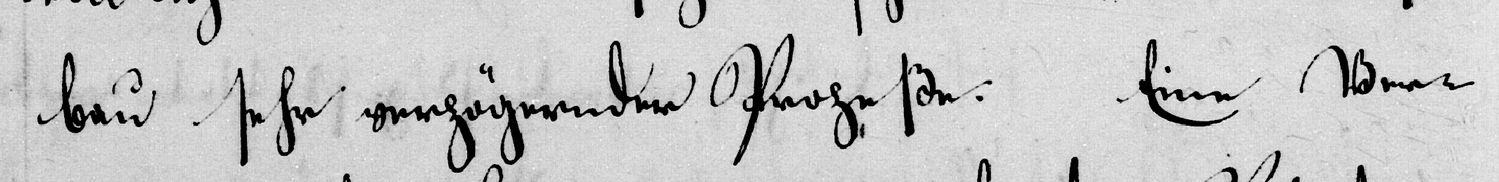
bau sehr verzögernder Prozeße. Eine Ver¬
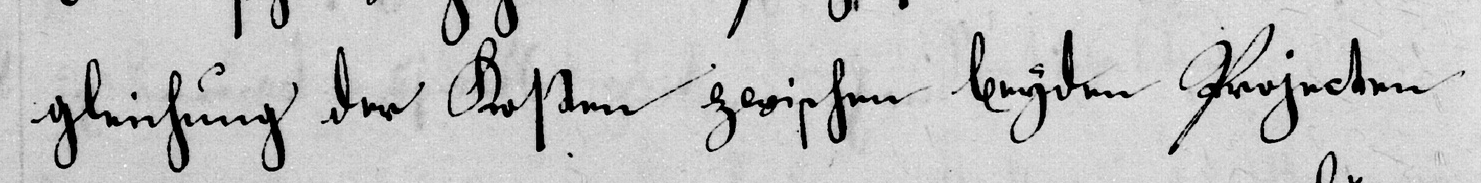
gleichung der Kosten zwischen beyden Projecten
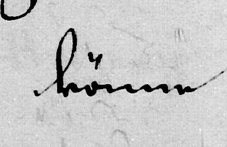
könne
